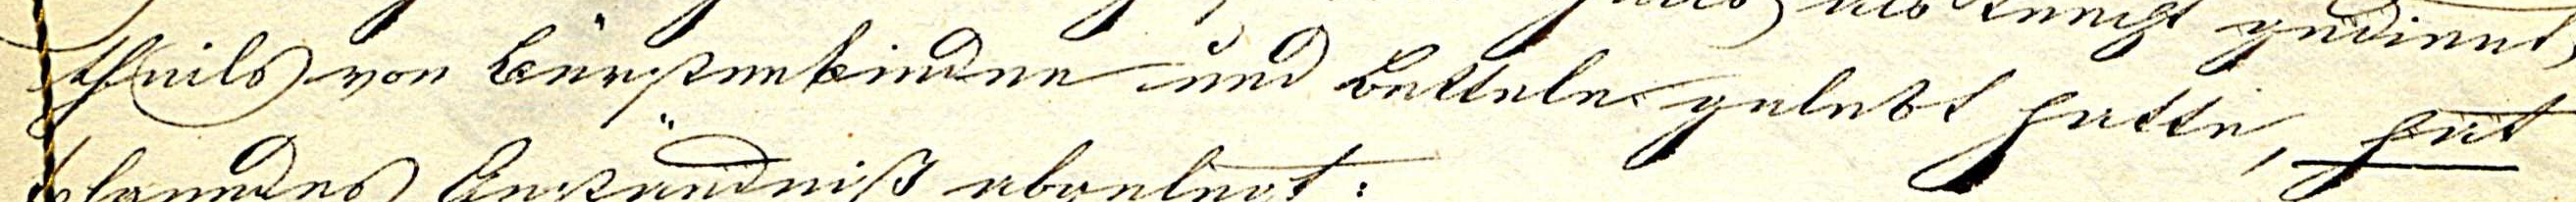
theils von Bürstenbinden und Betteln gelebt hatte, hat
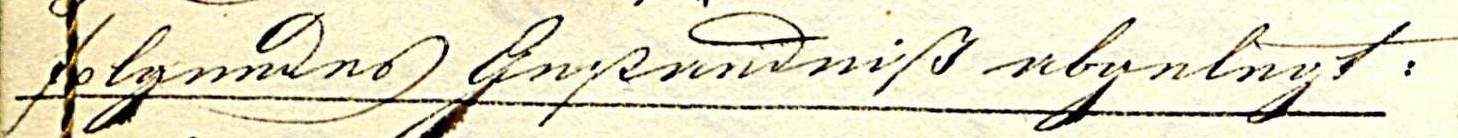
folgendes Geständniß abgelegt:
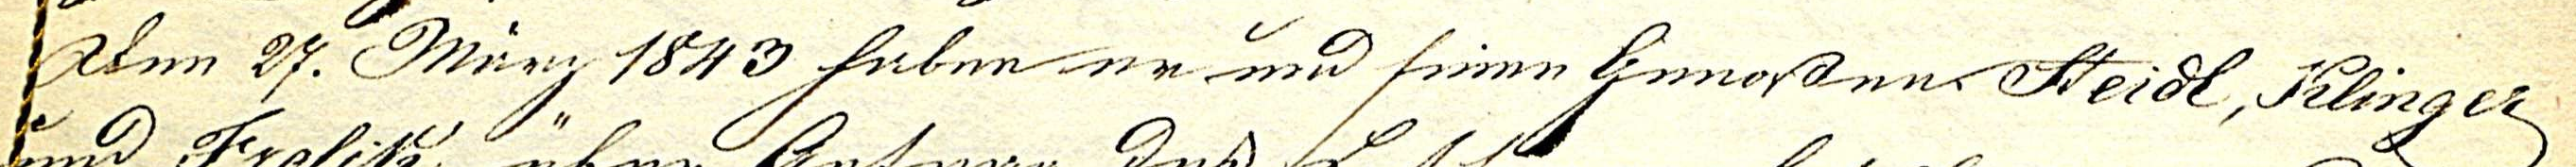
Am 27. März 1843 haben er und seine Genoßen Steidl, Klinger
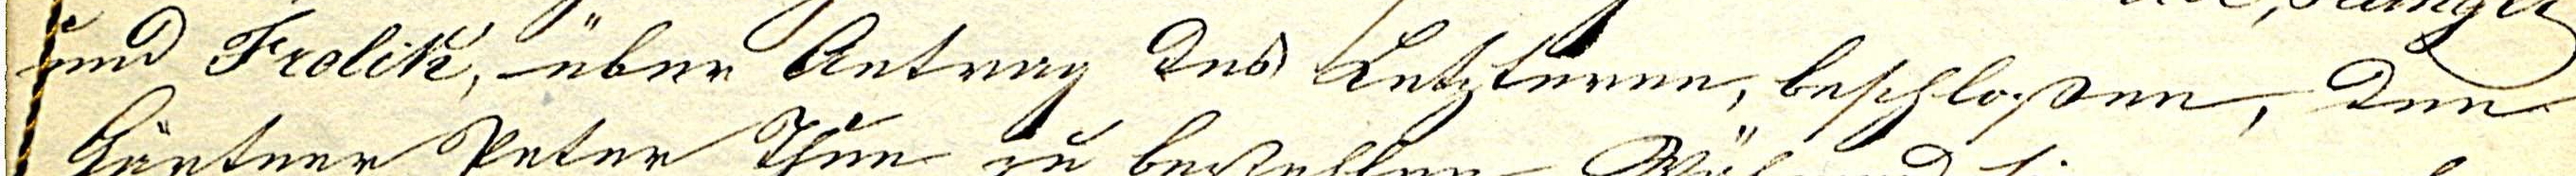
und Frolik, über Antrag des Letzteren, beschloßen, den
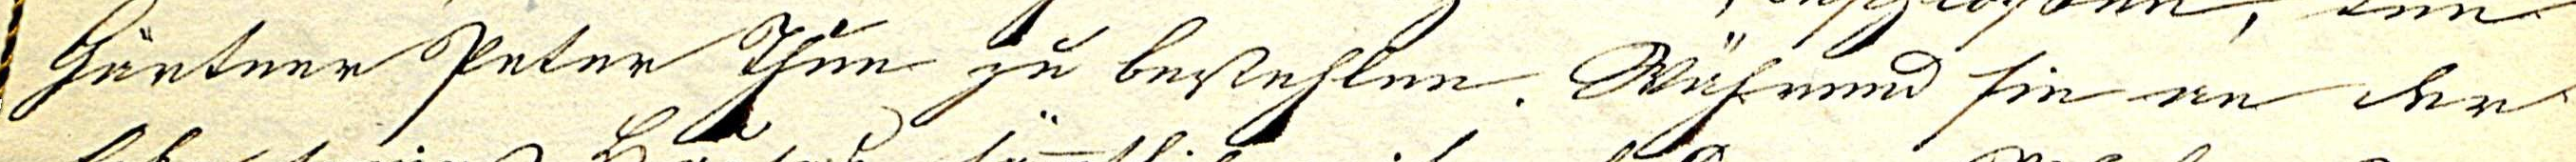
Gärtner Peter Thun zu bestehlen. Während sie an der
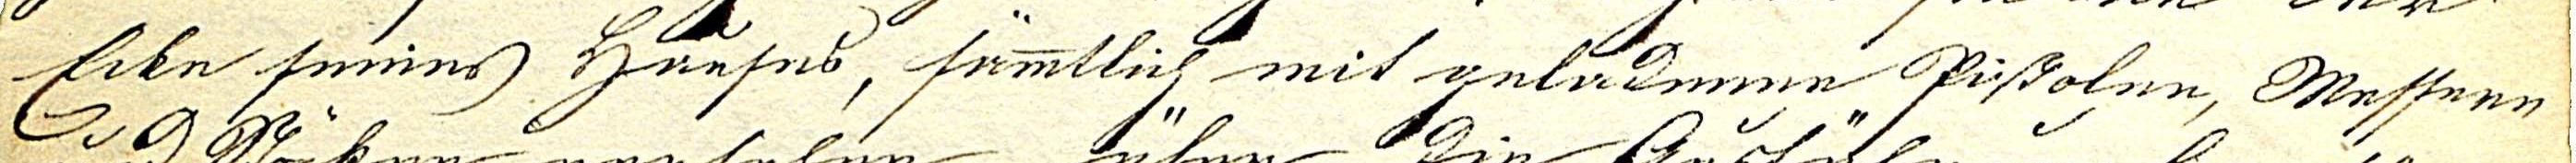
Ecke seines Hauses, sämmtlich mit geladenen Pistolen, Messern
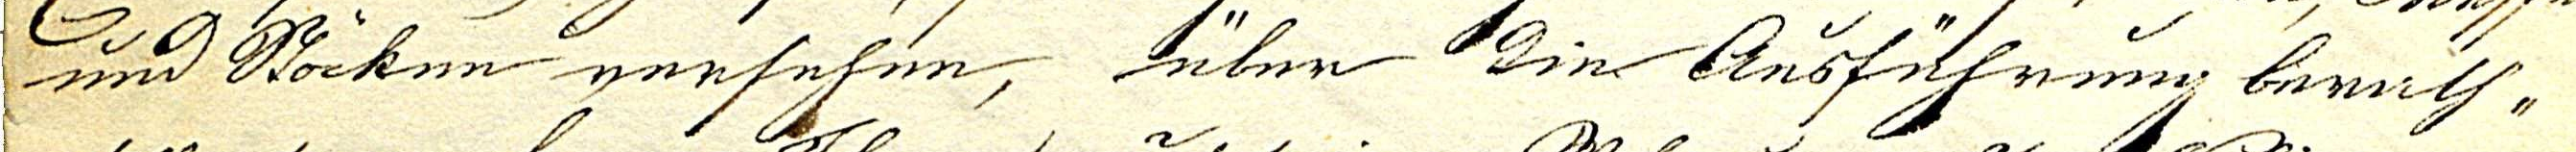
und Stöcken versehen, über die Ausführung berath¬
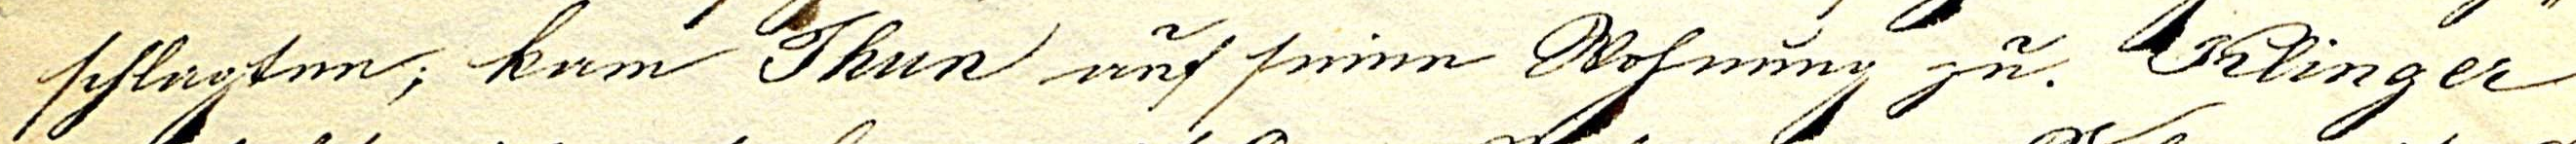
schlagten; kam Thun auf seine Wohnung zu. Klinger
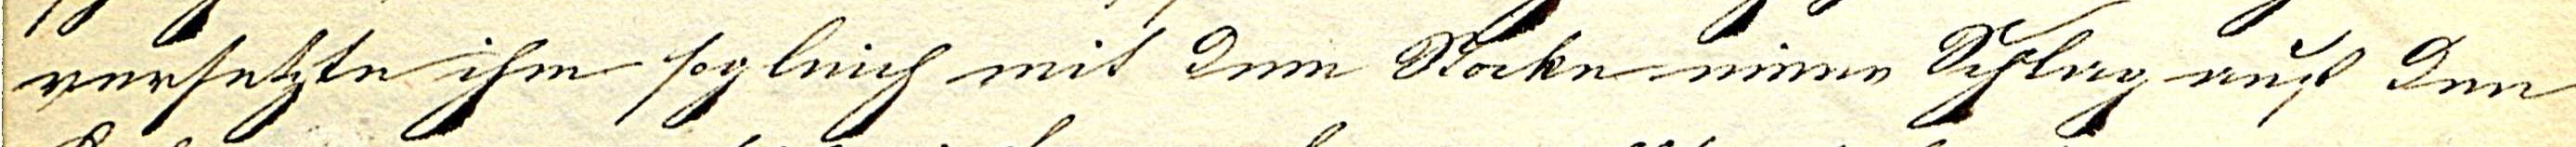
versetzte ihm sogleich mit dem Stock einen Schlag auf den
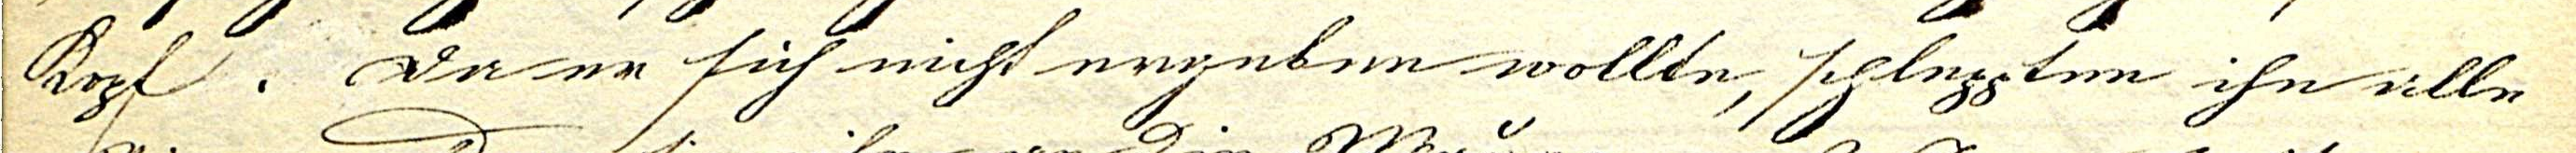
Kopf. Da er sich nicht ergeben wollte, schleppten ihn alle
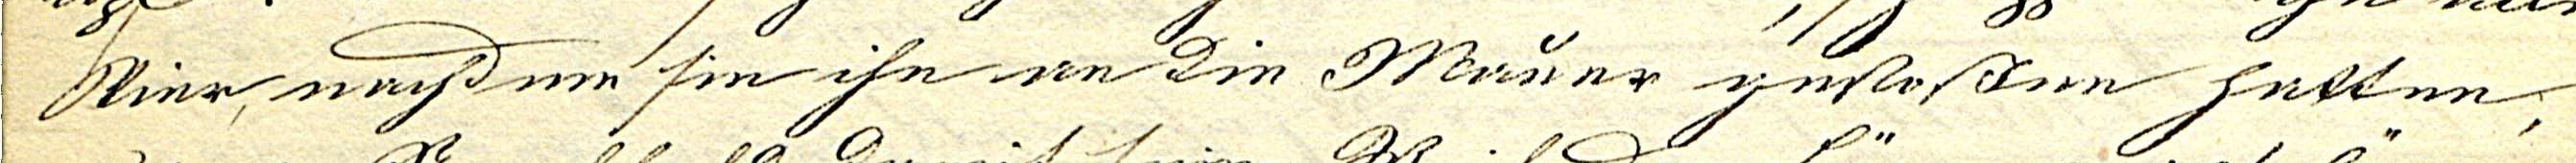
Vier, nachdem sie ihn an die Mauer gestoßen hatten;
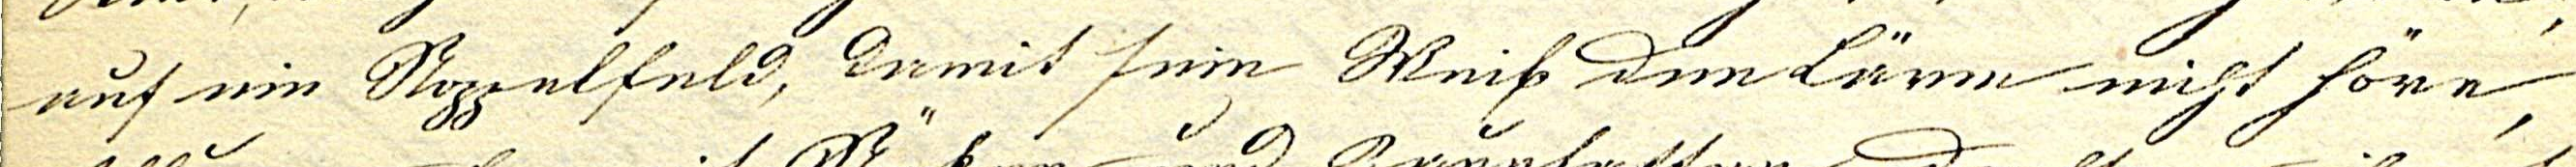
auf ein Stoppelfeld, damit sein Weib dem Lärm nicht höre,
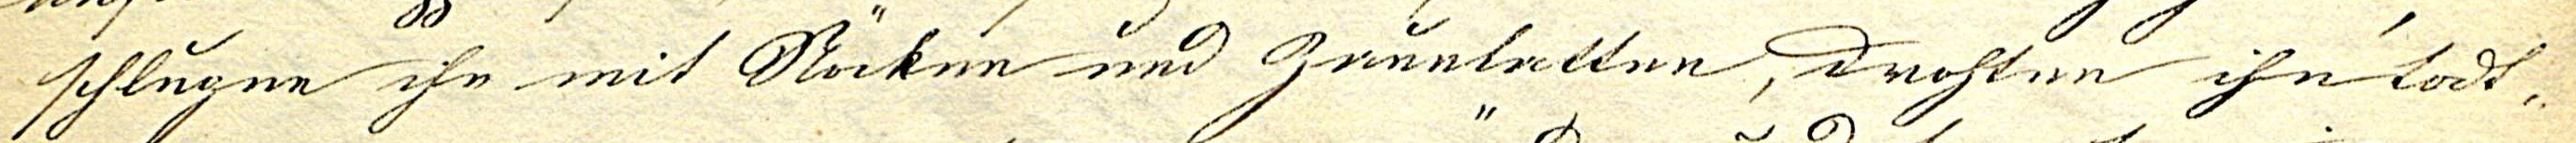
schlugen ihn mit Stöcken und Zaunlatten, drohten ihn todt¬
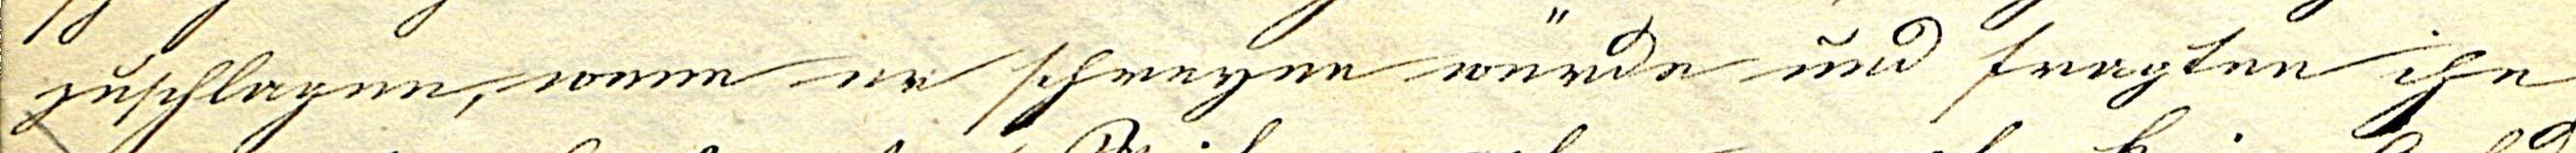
zuschlagen, wenn er schreyen würde und fragten ihn
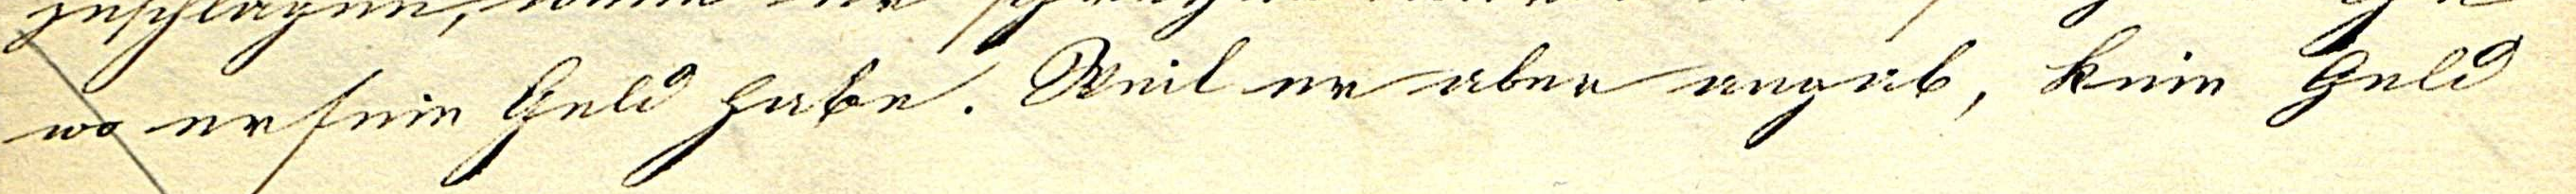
wo er sein Geld habe. Weil er aber angab, kein Geld
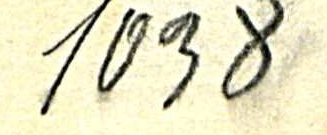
1038
